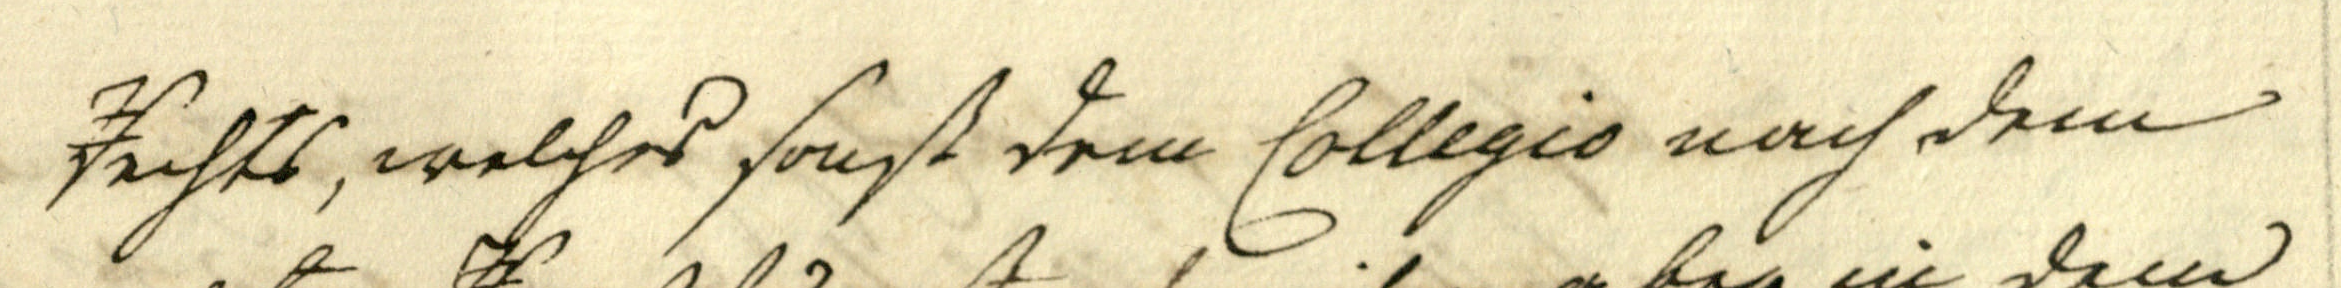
Rechts, welches sonst dem Collegio nach dem
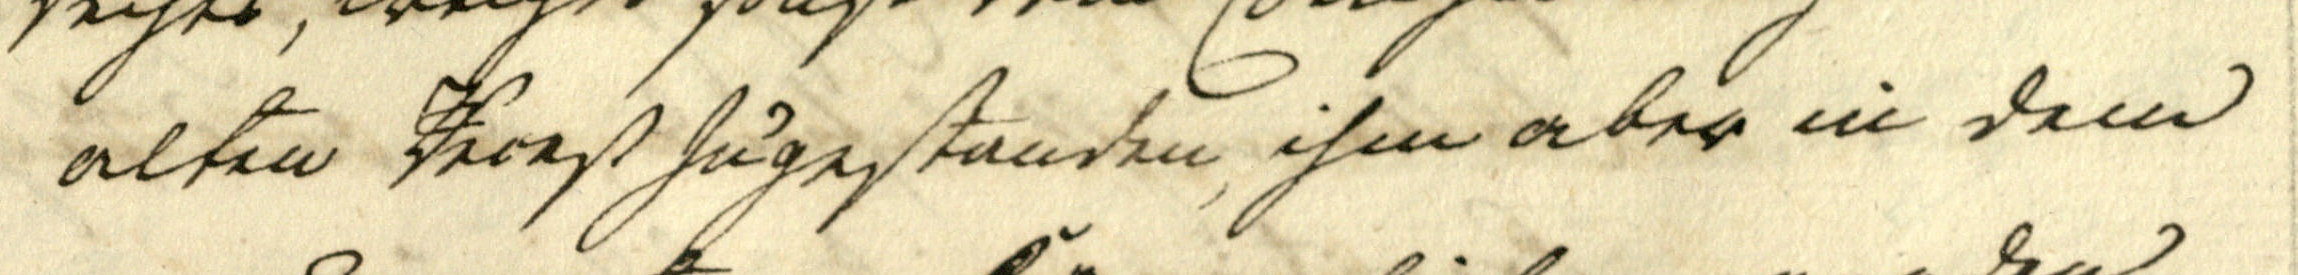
alten Receß zugestanden, ihm aber in dem
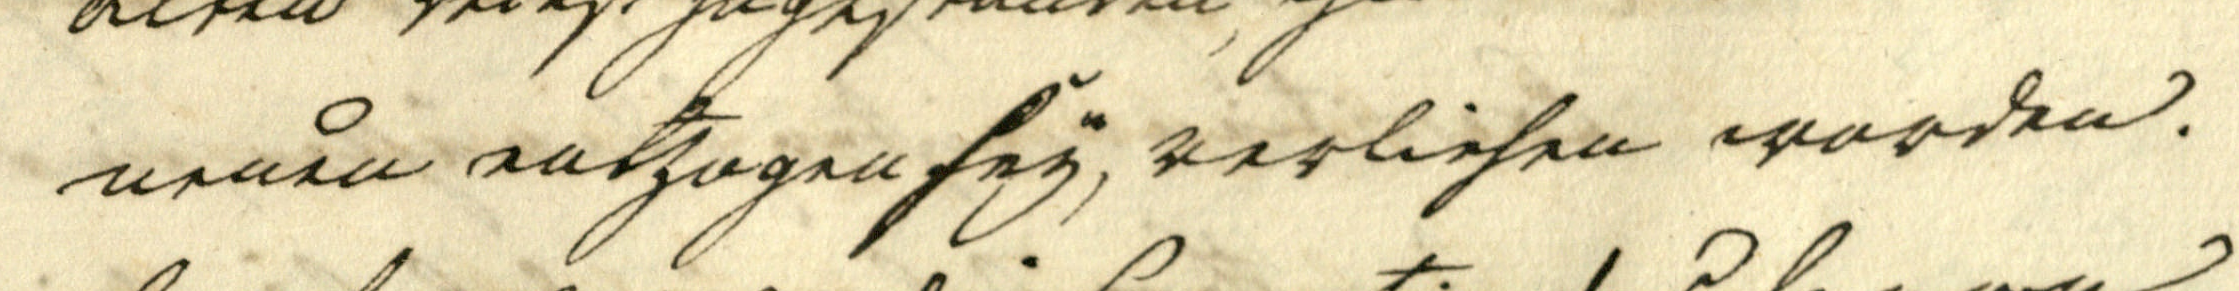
neuen entzogen seÿ, verliehen worden.
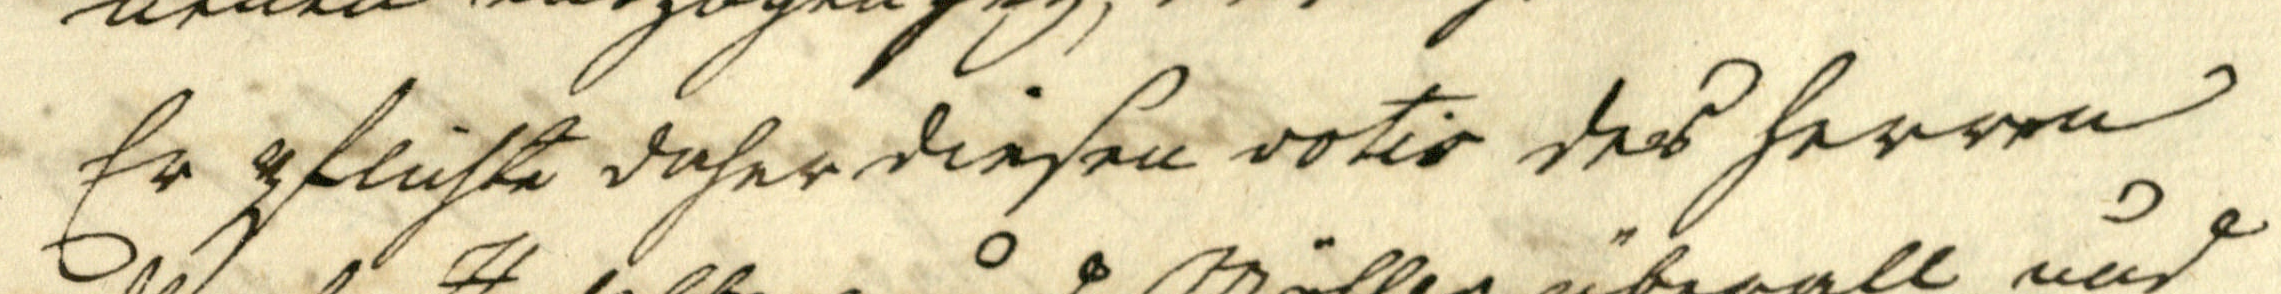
Er pflichte daher diesen votis der Herren
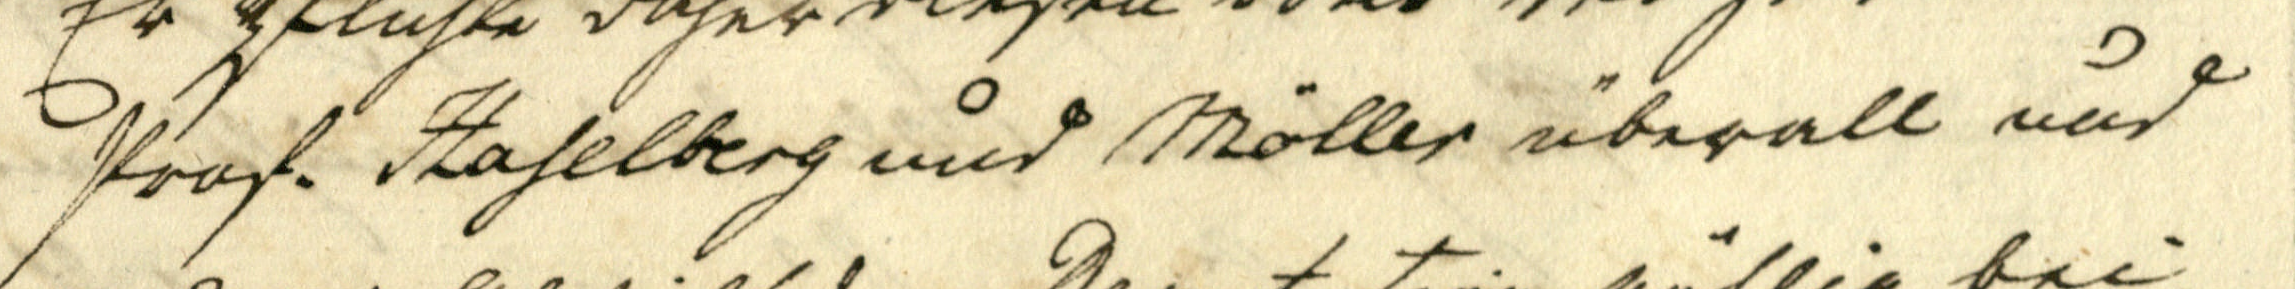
Prof. Haselberg und Möller überall und
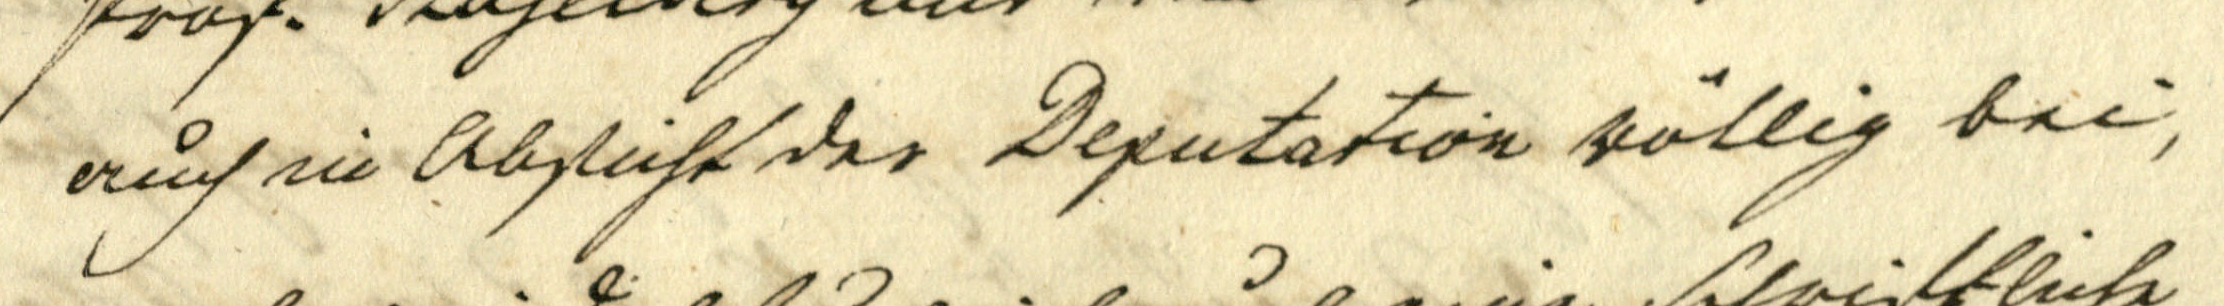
auch in Absicht der Deputation völlig bei,
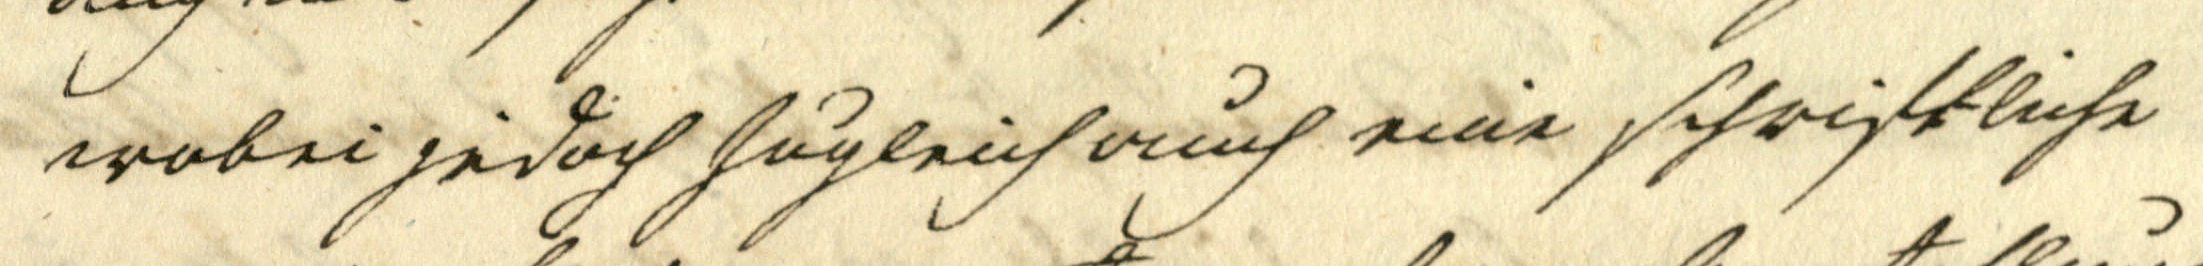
wobei jedoch zugleich auch eine schriftliche
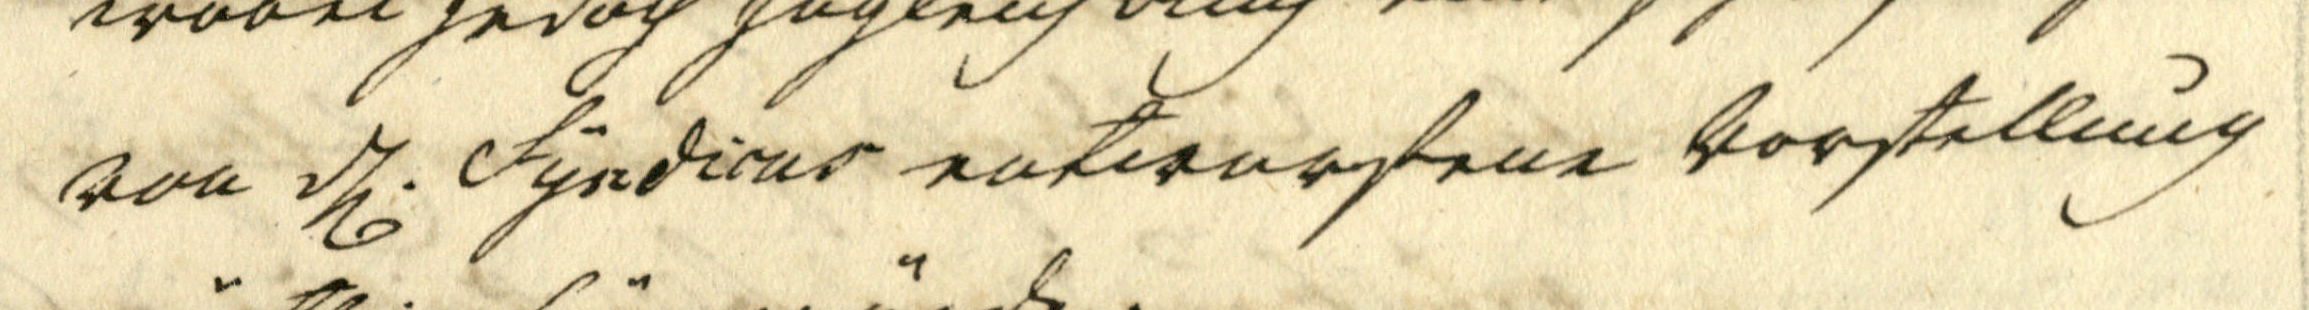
von dh. Sÿndicus entworfene Vorstellung
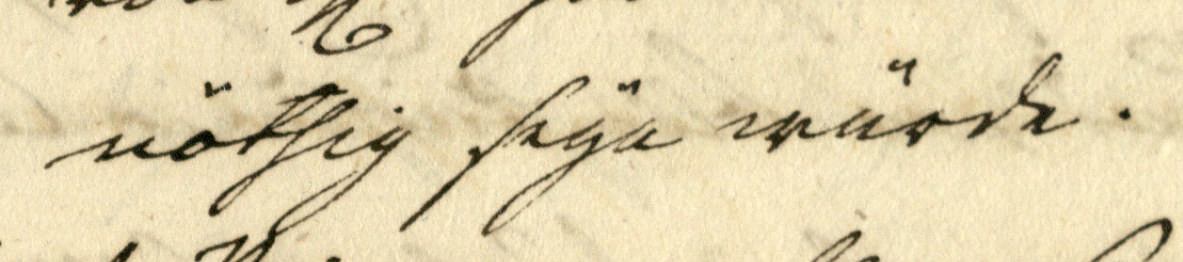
nöthig seÿn würde.
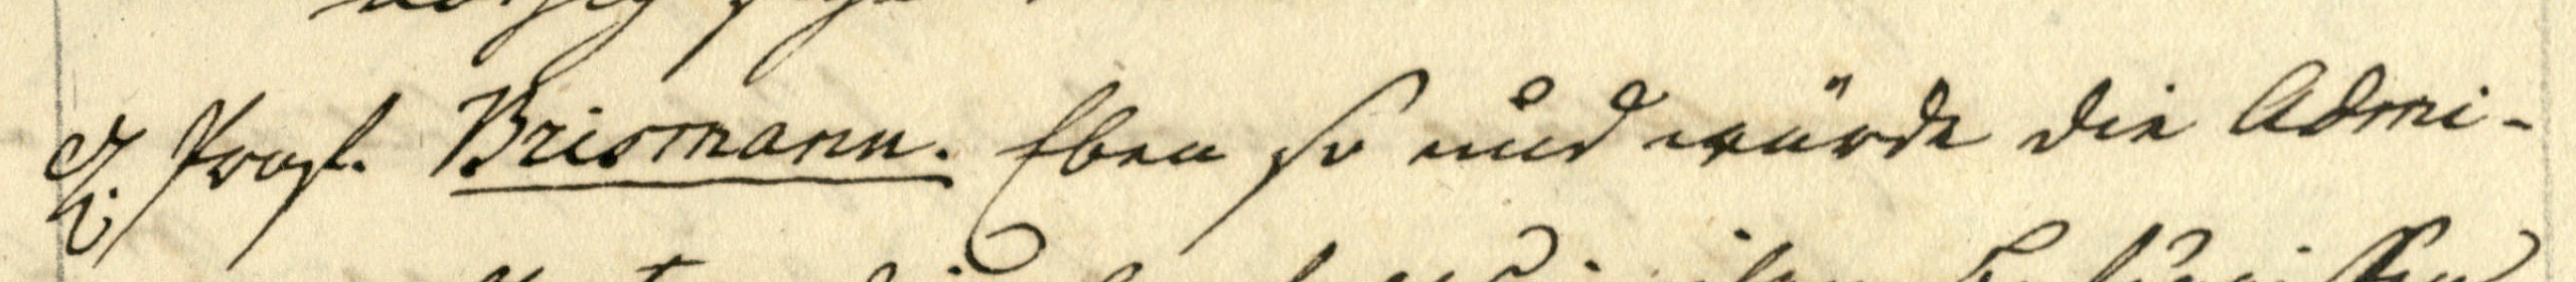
dh. Prof. Brismann. Eben so und würde die Admi¬
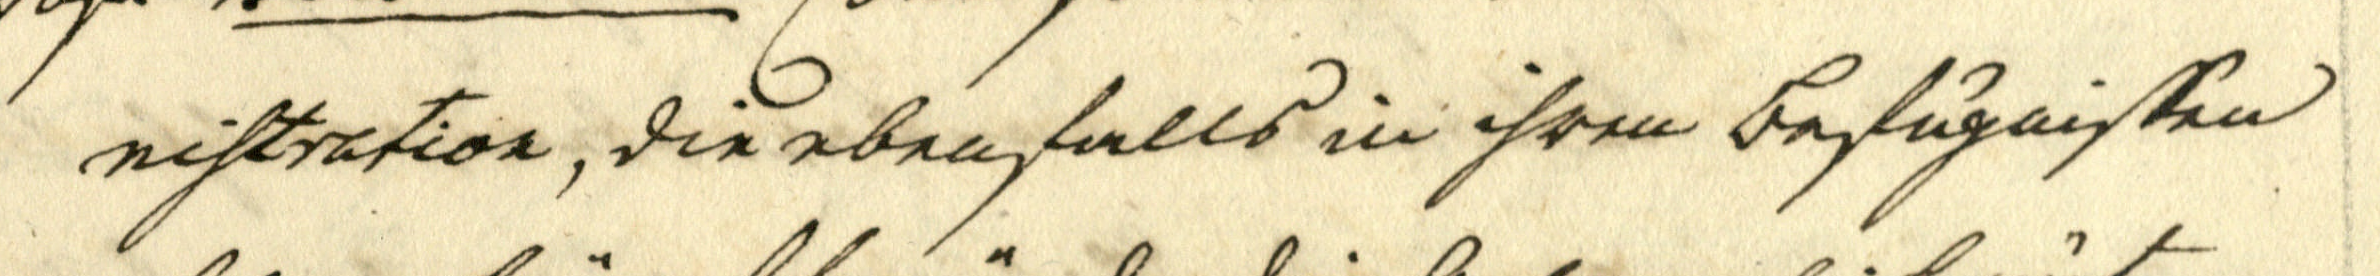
nistration, die ebenfalls in ihren Befugnissen
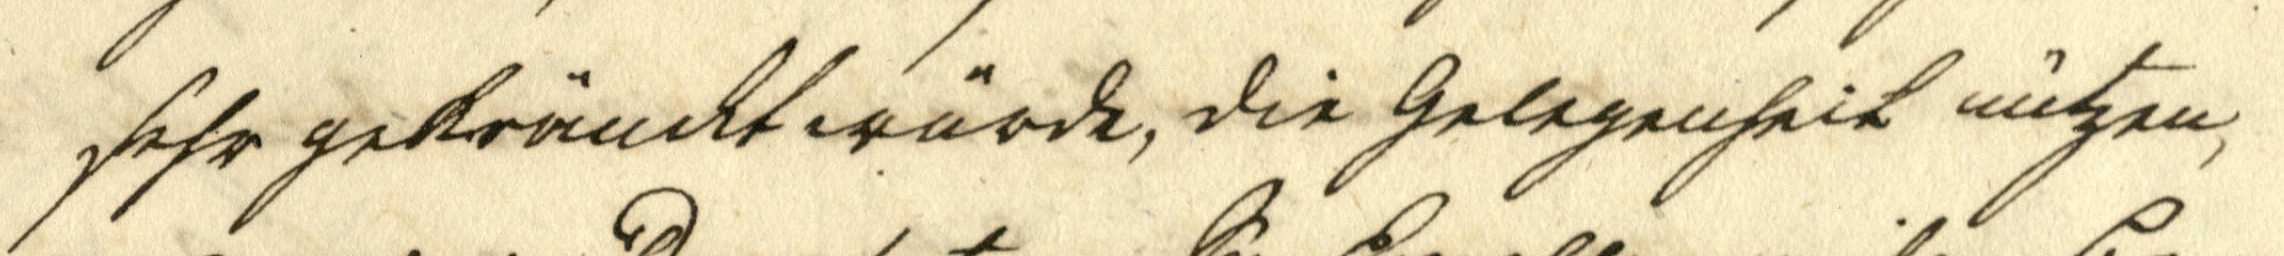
sehr gekränckt würde, die Gelegenheit nutzen,
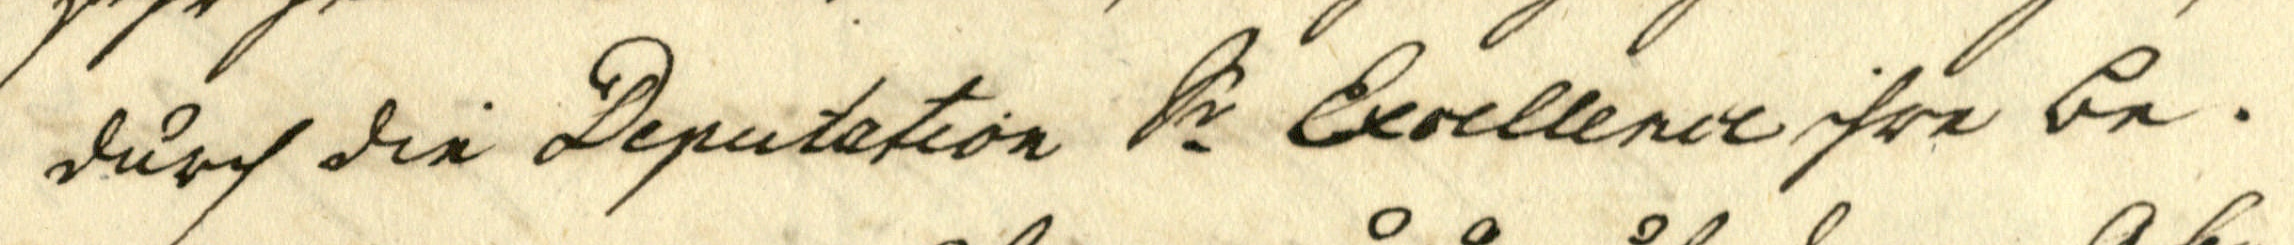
durch die Deputation Sr Excellence ihre Be¬
